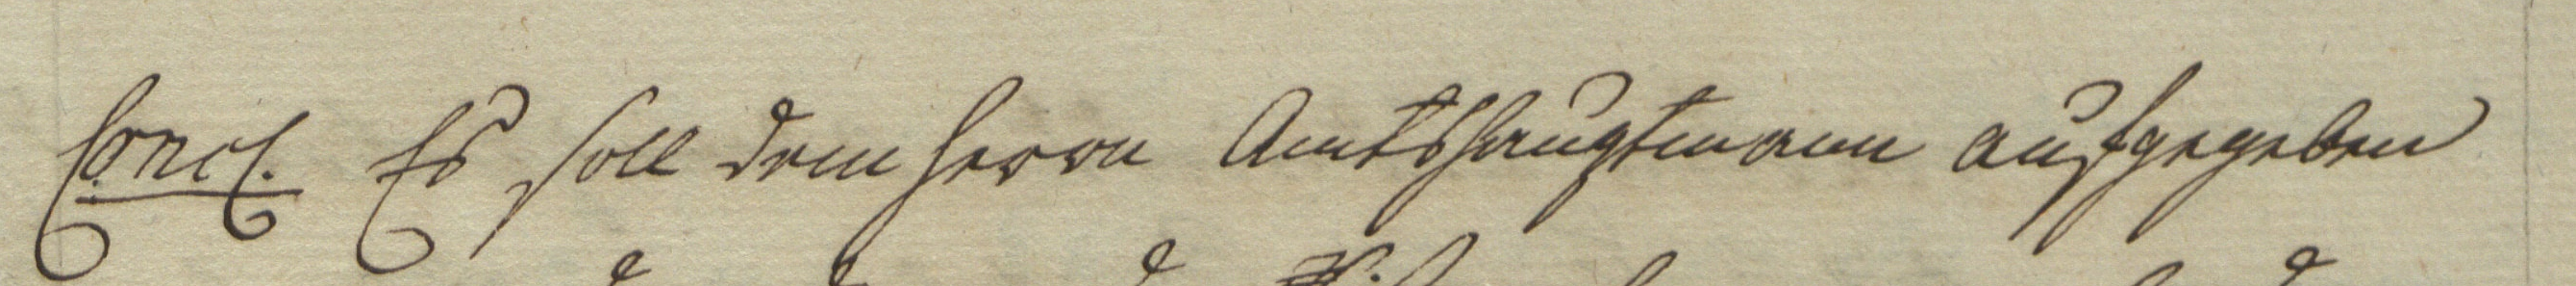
Concl. Es soll dem Herrn Amtshauptmann aufgegeben
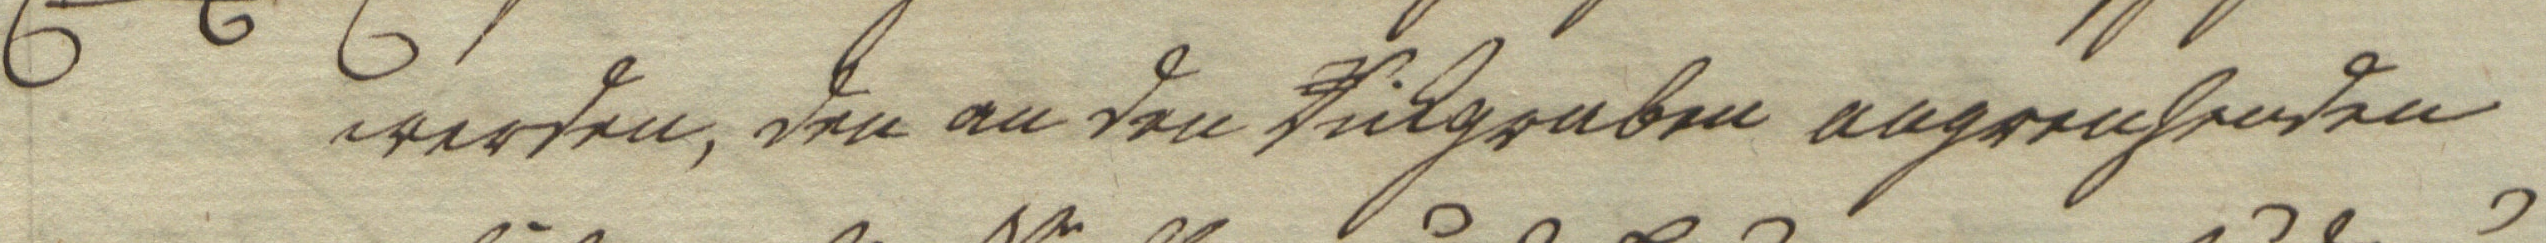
werden, den an den Rickgraben angrenzenden
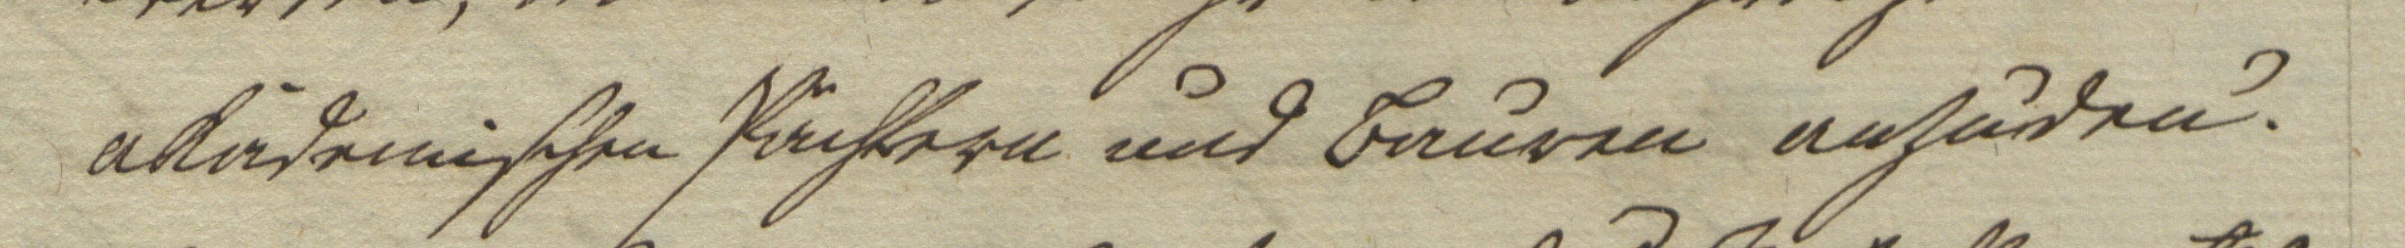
akademischen Pächtern und Bauren anzudeu¬
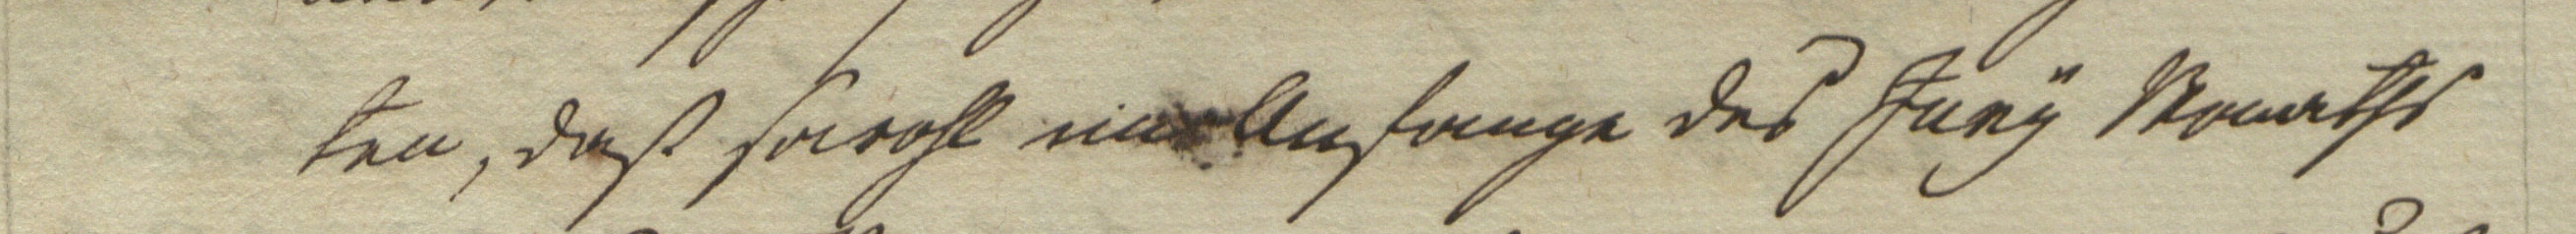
ten, daß sowohl im Anfange des Juny Monaths
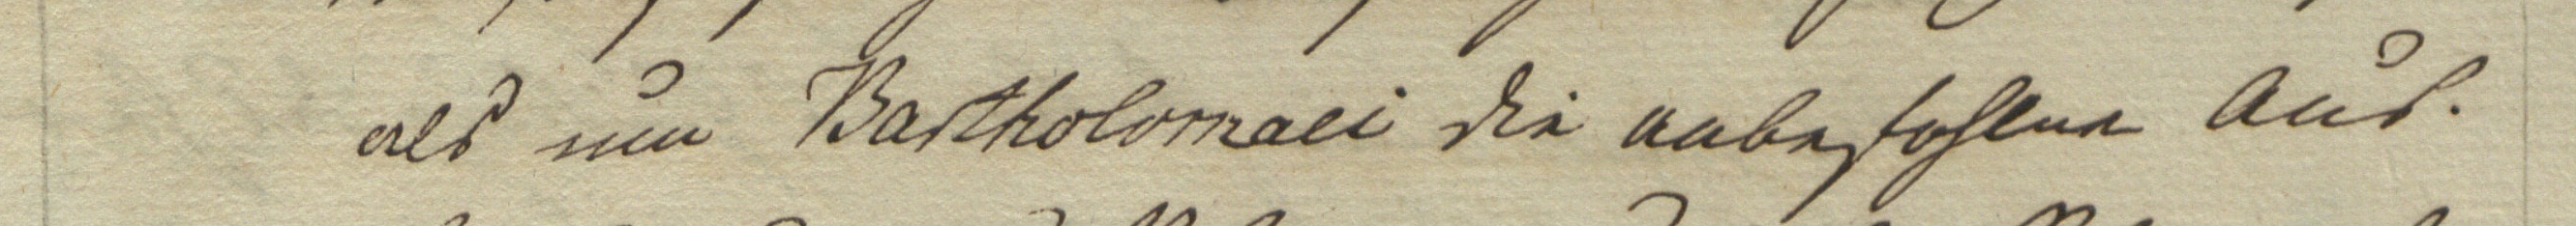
als um Bartholomaei die anbefohlne Aus¬
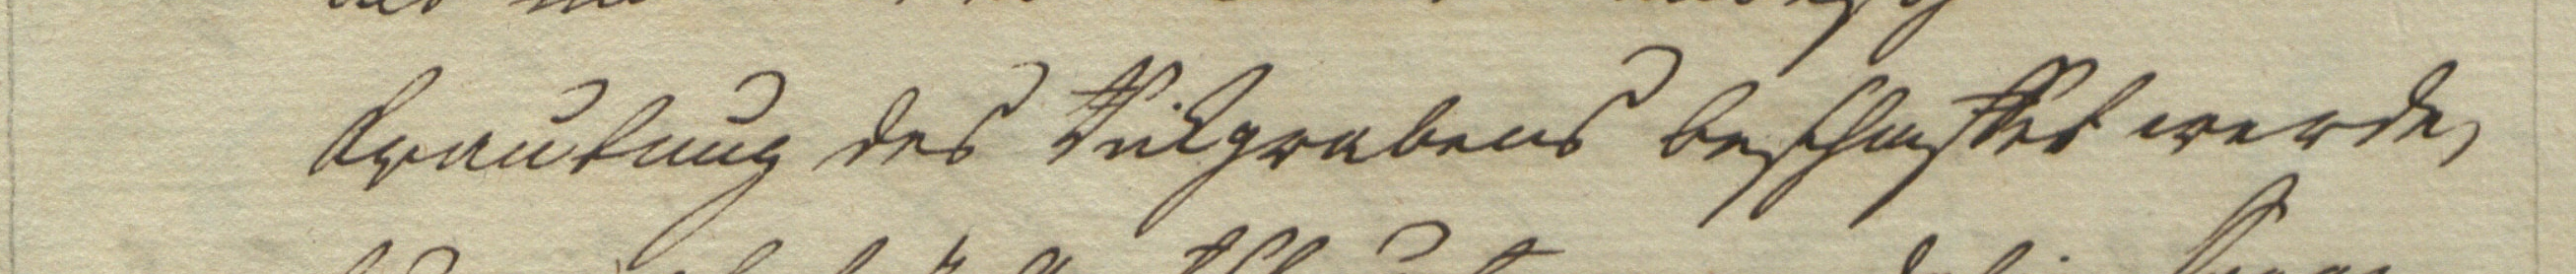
krautung des Rickgrabens beschaffet werde,
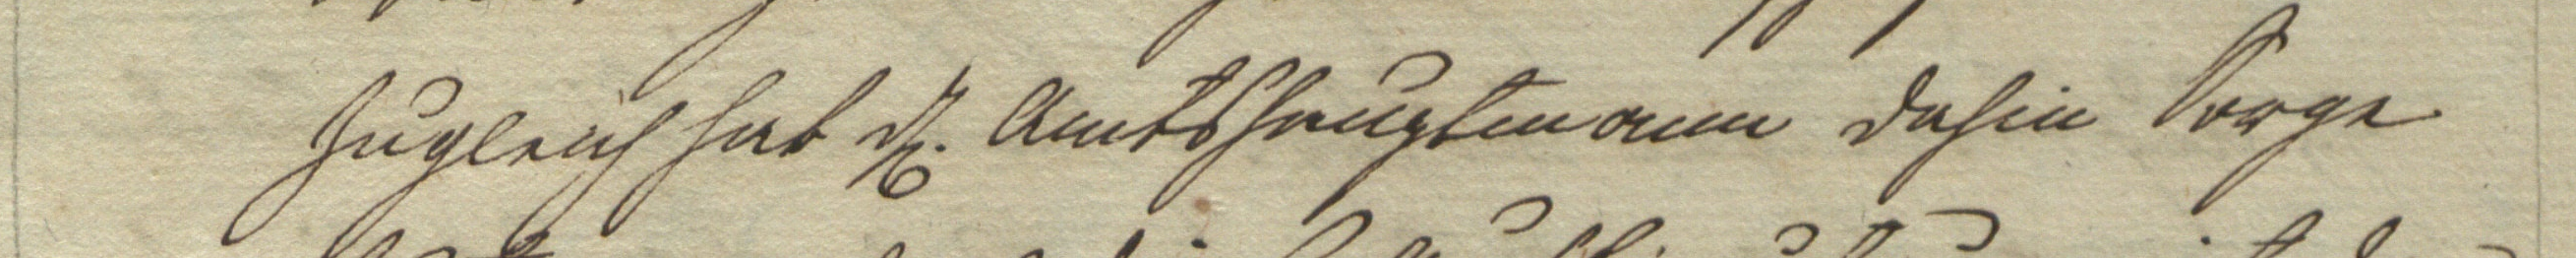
zugleich hat dh. Amtshauptmann dahin Sorge
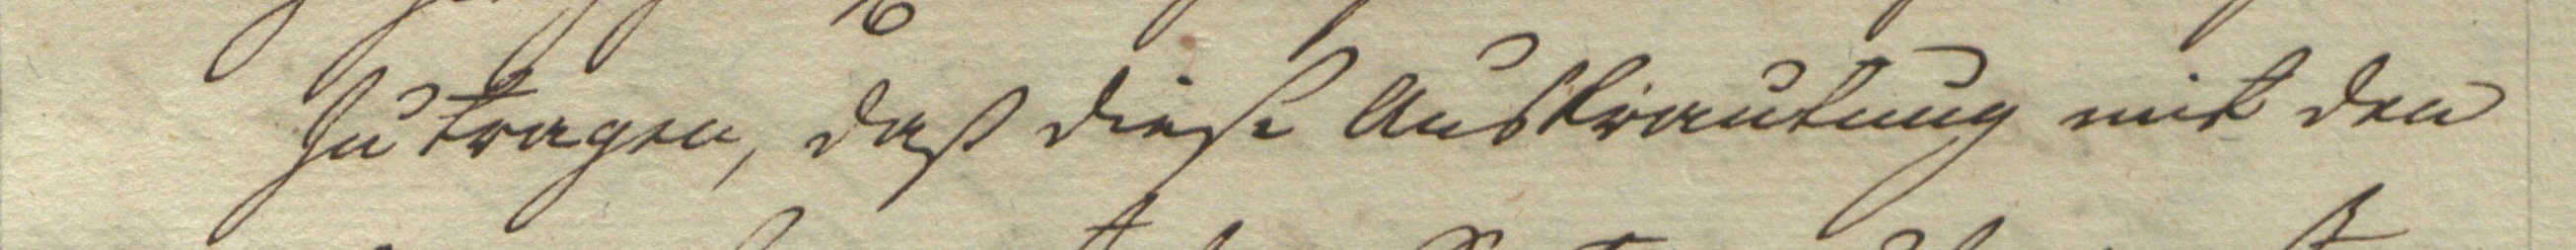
zu tragen, daß diese Auskrautung mit den
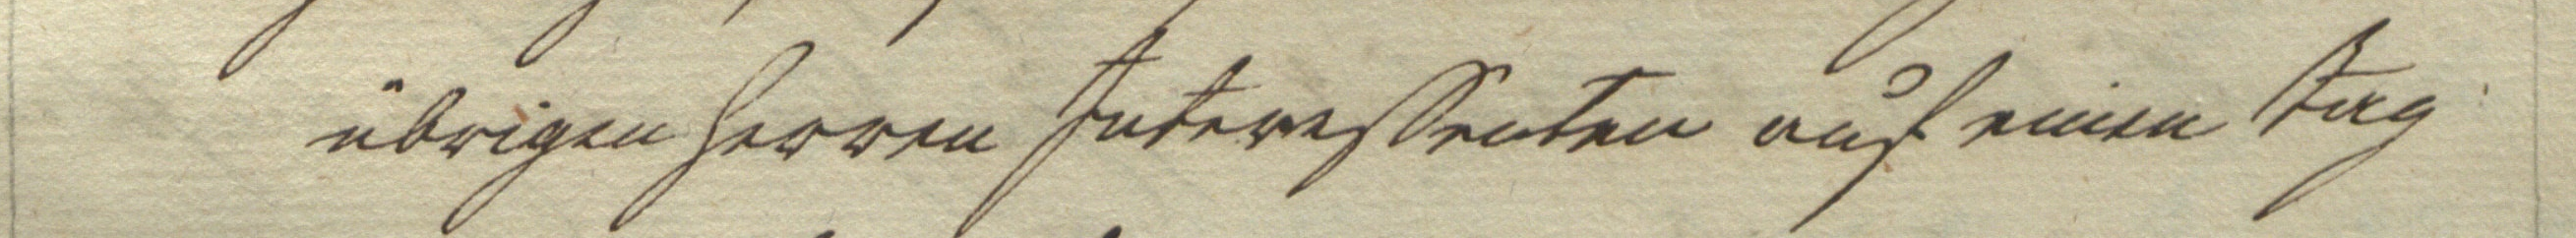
übrigen Herren Interessenten auf einen Tag
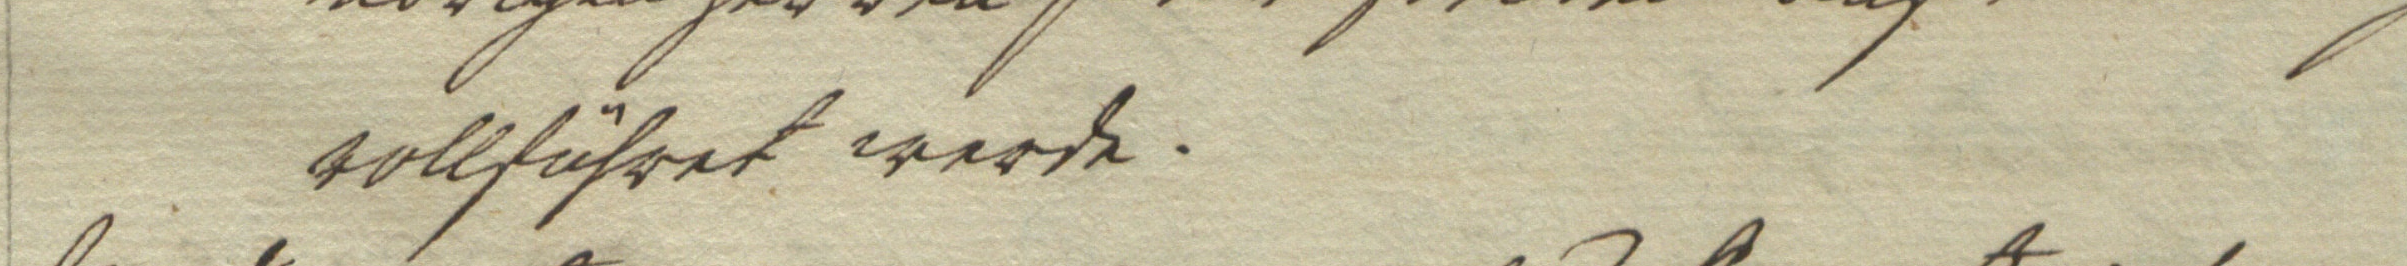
vollführet werde.
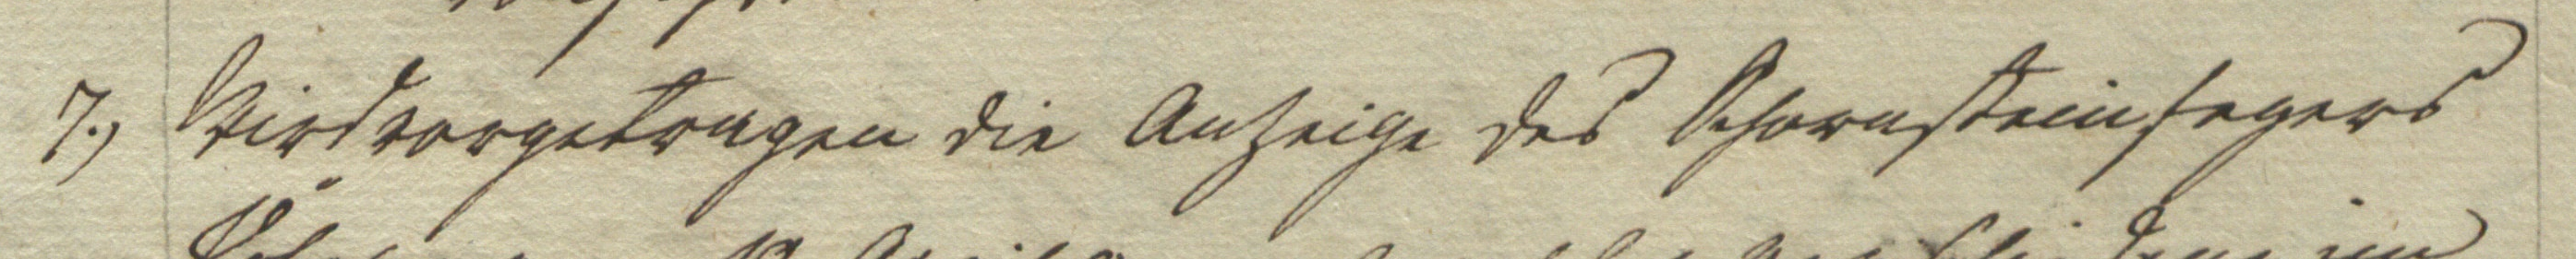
7., Wird vorgetragen die Anzeige des Schornsteinfegers
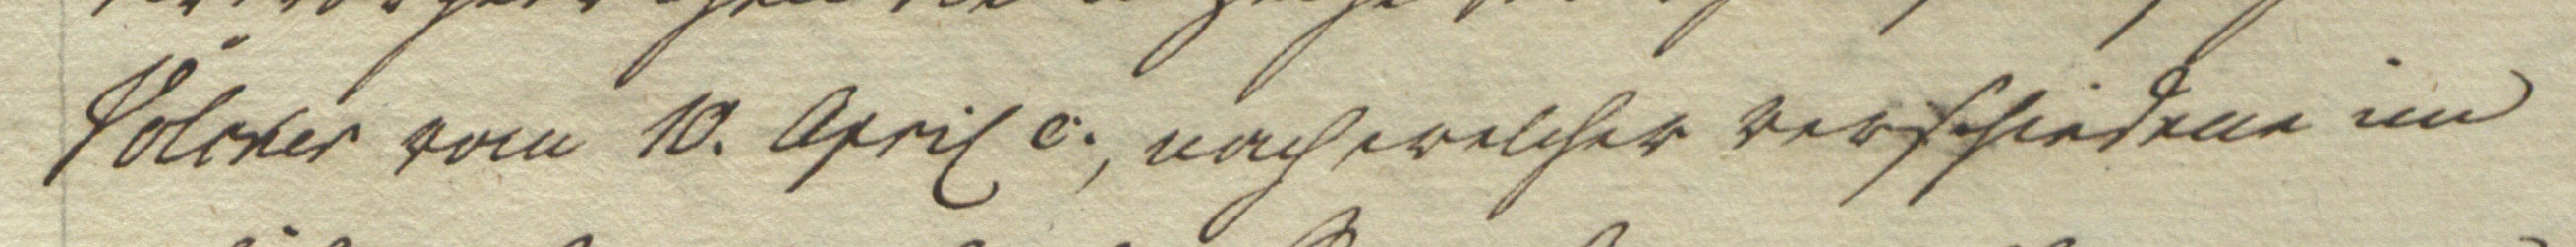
Volcker vom 10. April c., nach welcher verschiedene im
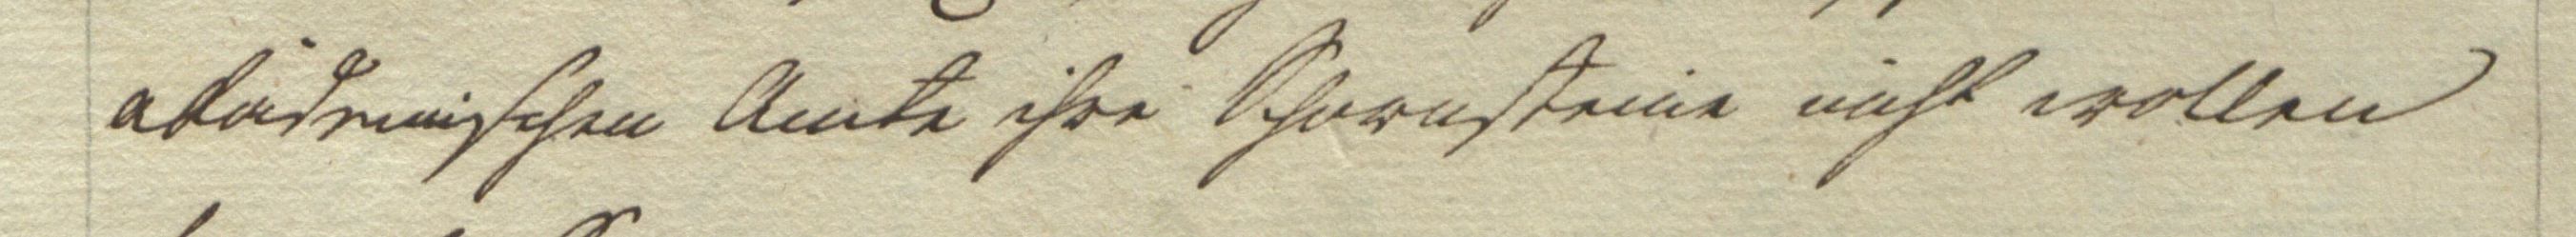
akademischen Amte ihre Schornsteine nicht wollen
